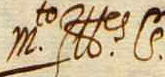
M.to Jll.es S.res
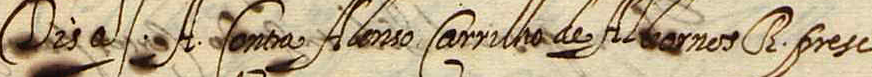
Dis a J. A. Contra Alonso Carrilho de Albornos R. preso
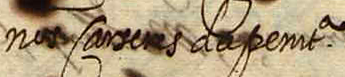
nos Carseres da penit.a
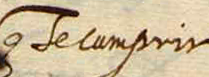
q̄ se cumprir
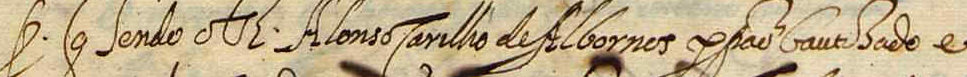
Ꝓ. q̄ Sendo o R. Alonso Carilho de Albornos xpaõ bautizado e
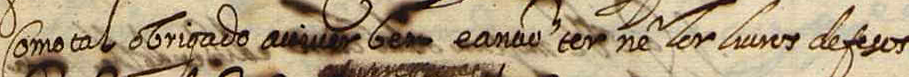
Como tal obrigado a uiuer bem e a naõ ter nē ler liuros defesos
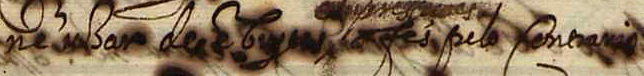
nē uzar de ēbustes o fes pelo Contrario
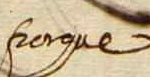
porque
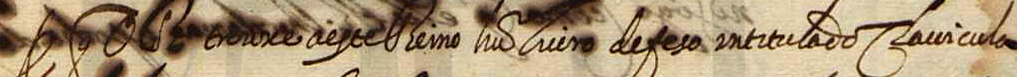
Ꝓ q̄ O R trouxe a este Reino hū liuro defeso intitulado Clauicula
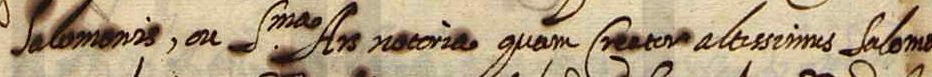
Salomonis, ou S.ma Ars notoria quam Creator altissimus Salomo
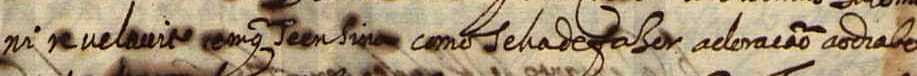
ni reuelauit em q̄ se ensina como se ha de fazer adoraçaõ ao diabo
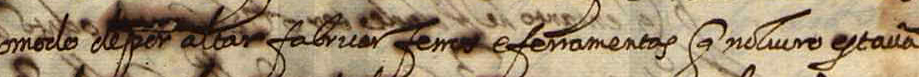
o modo de por altar fabricar ferros e ferramentas q̄ no liuro estauā
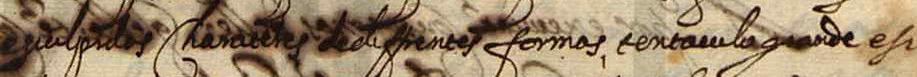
esculpidos Charateres de diffrentes formas, tentaculo grande e si
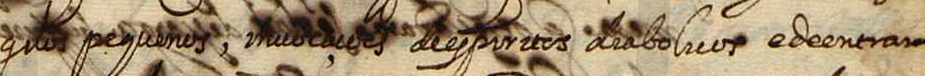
gnos pequenos, inuocações de espiritos diabolicos e de entrar
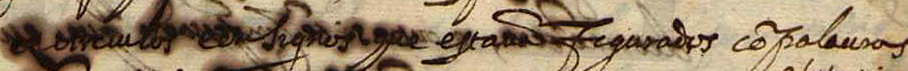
em circuilos e em signos que estauaõ figurados cō palauras
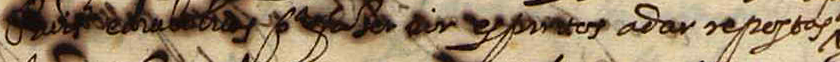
Ruĩs e diabolicas pa fazer uir espiritos a dar repostas
